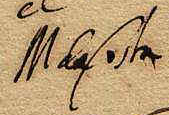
Mel da Costa
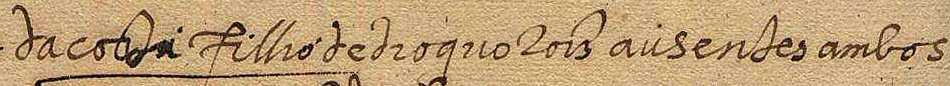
da costa filho de dioguo Roiz̄ ausentes ambos
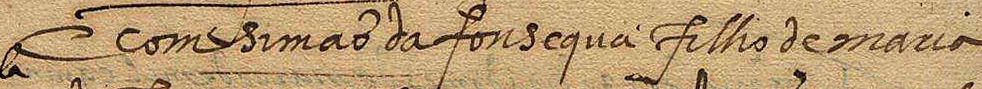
e com simaõ da fonsequa filho de maria
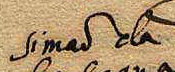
Simaõ da
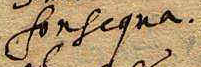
fonsequa.
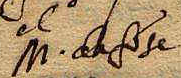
Mel. da fōse
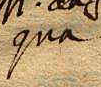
qua
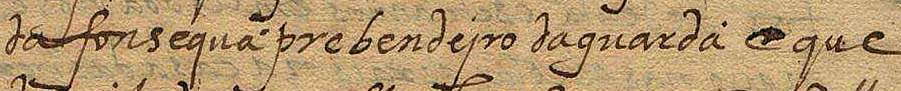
da fonsequa prebendejro da guarda e que
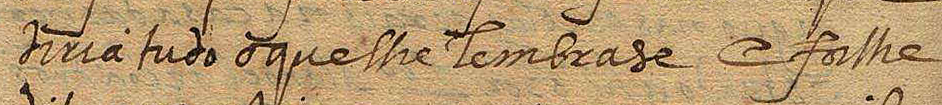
diria tudo o que lhe lembrase e foilhe
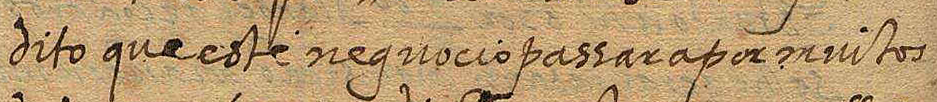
dito que este neguocio passara por muitos
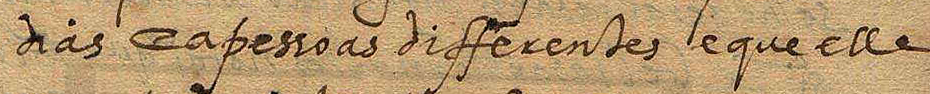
dias e a pessoas differentes e que elle
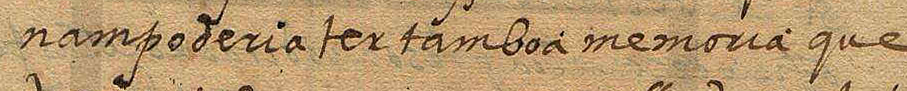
nam poderia ter tam boa memoria que
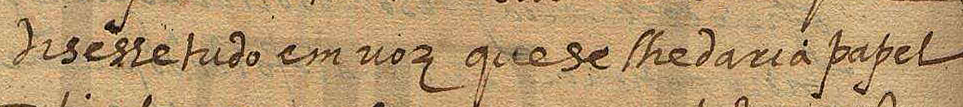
disesse tudo em uoz que se lhe daria papeL
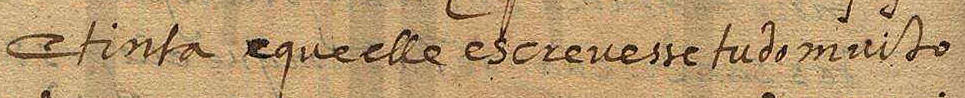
e tinha e que elle escreuesse tudo muito
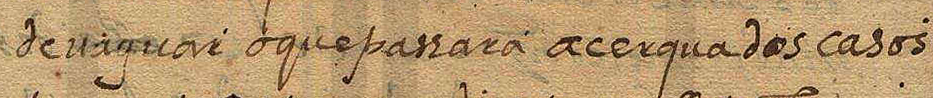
deuaguar o que passara acerqua dos casos
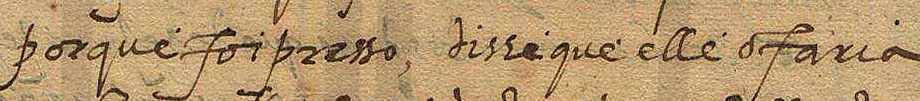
porque foi presso, disse que elle o faria
